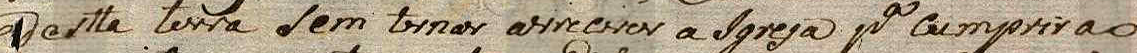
destta terra sem tornar a rrecorer a Igreja pa cumprir ao
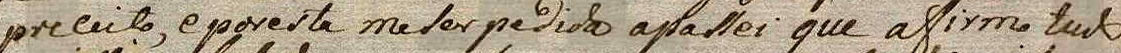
preceito, e por esta me ser pedida a passei que afirmo tudo
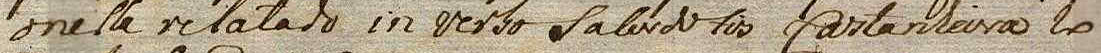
o nella relatado in verbo Sacerdotis Castanheira 10
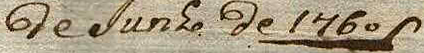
de Iunho de 1760
